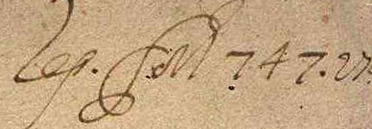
Rep. folh 747. Vs.o
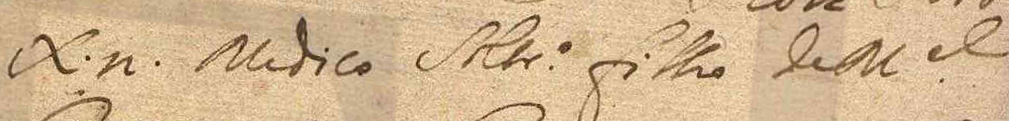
x. n. Medico soltr.o filho de M.el
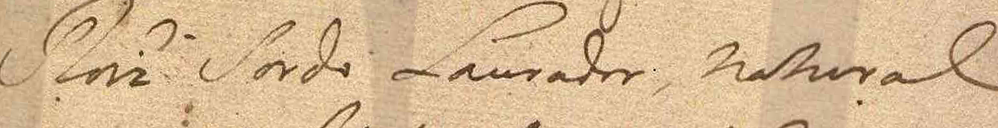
Roiz̄ Sordo Laurador, natural
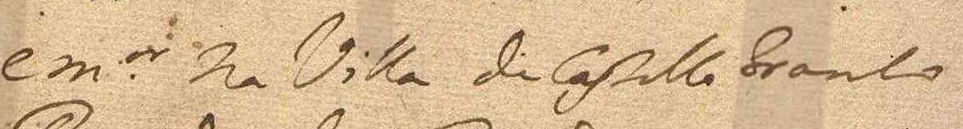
e m.or na Villa de castello branco
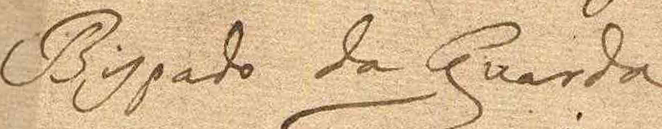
Bispado da Guarda
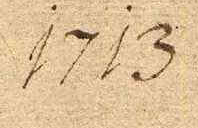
i7i3
